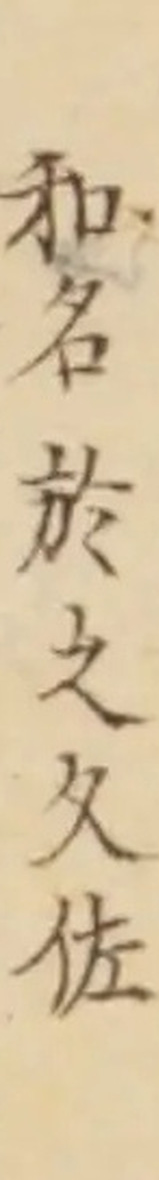和名於之夂佐

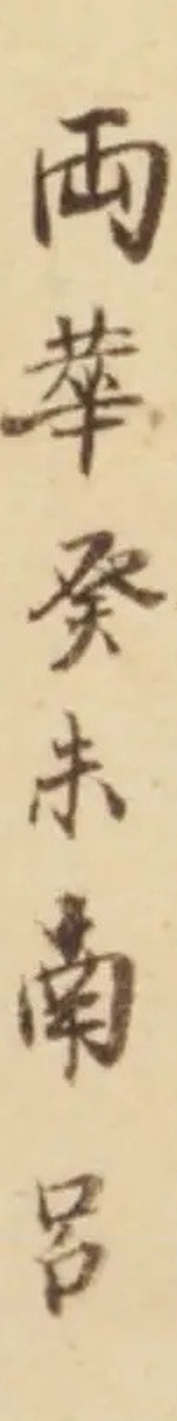両華癸未南呂

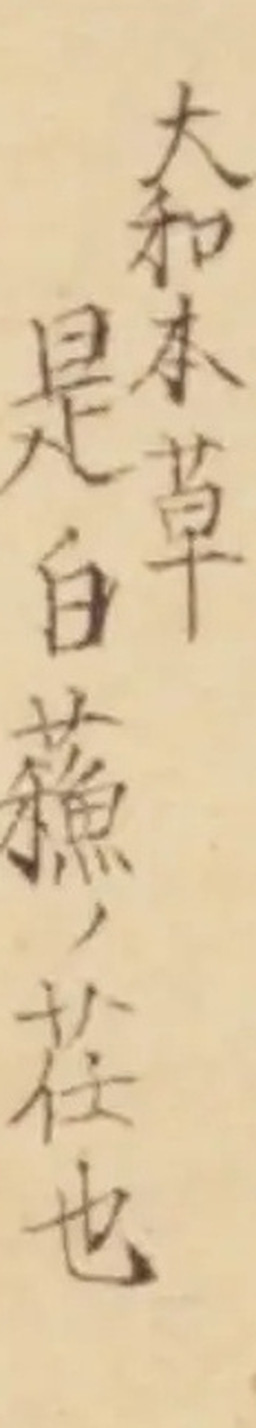是白蘇荏也
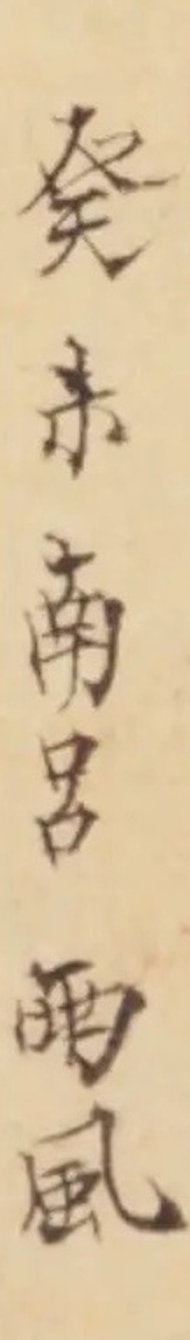癸未南呂雨風
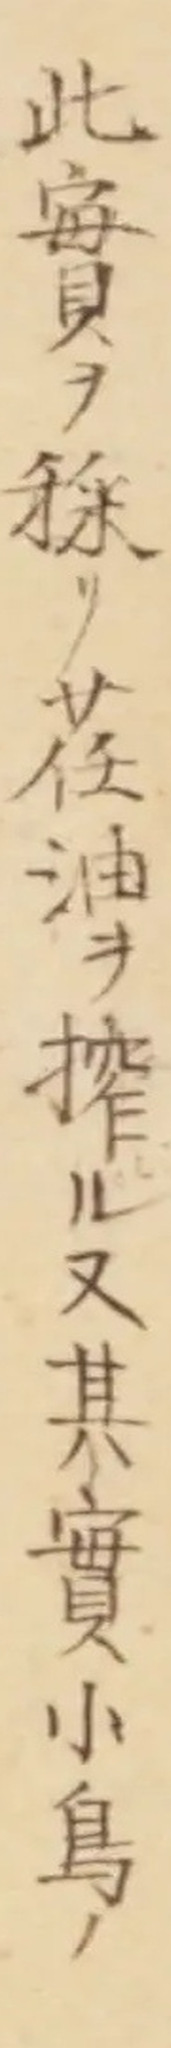此実ヲ𥟩リ荏油搾ル又其実小鳥ノ
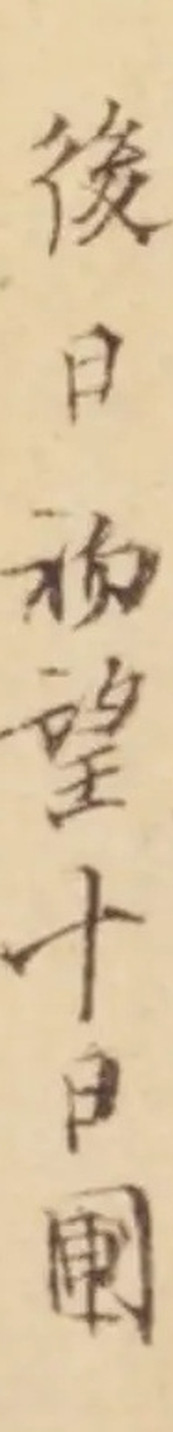後日望十日圃
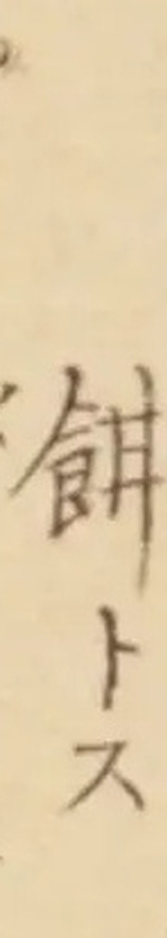餌トス
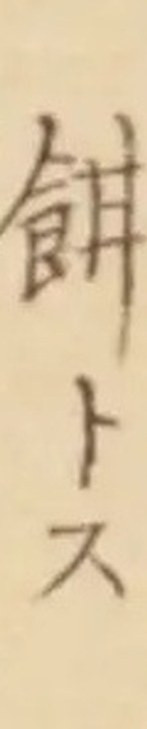餌トス
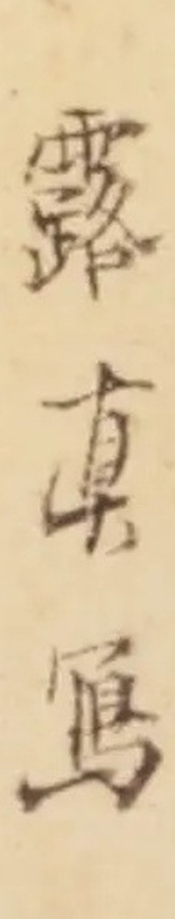露真写
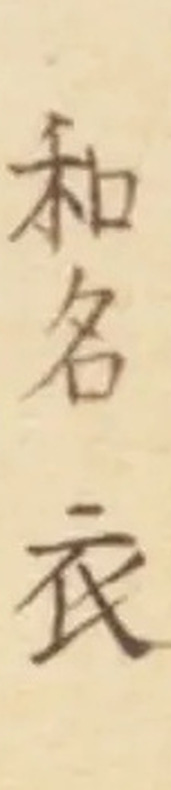和名衣
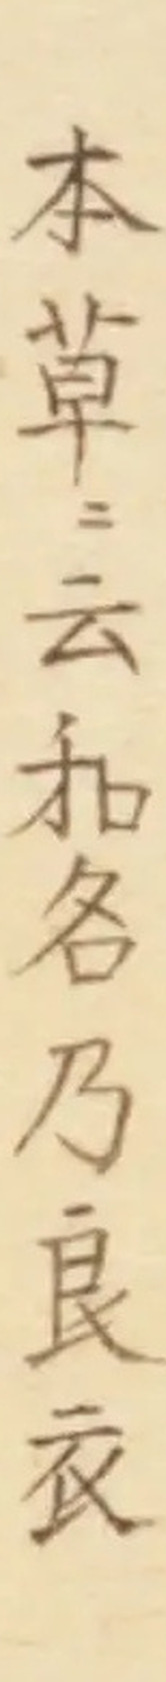本草云和名乃良衣

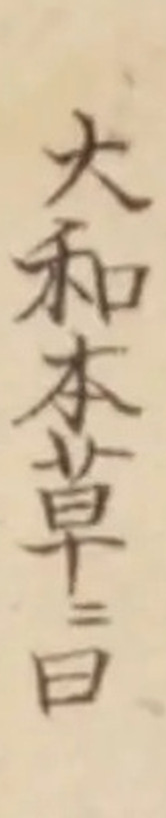大和本草曰
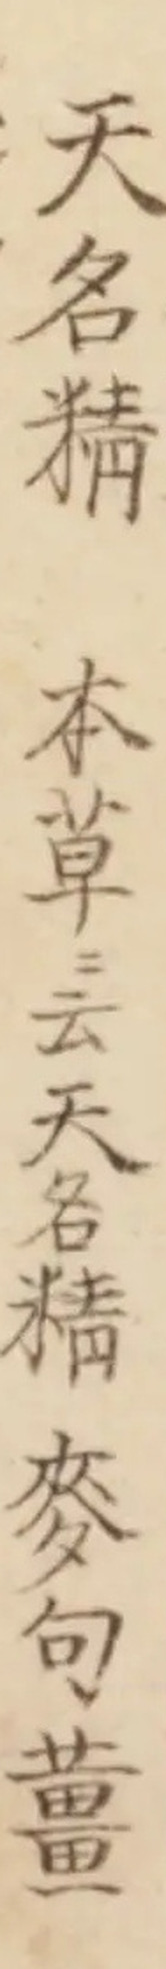天名精本草云天名精麦句薑
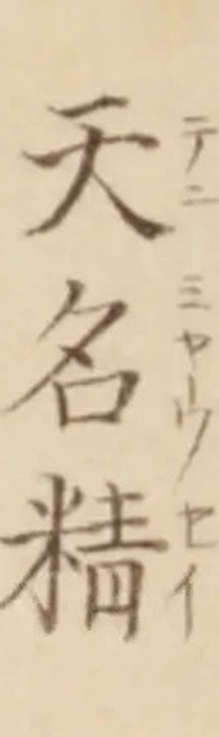天名精
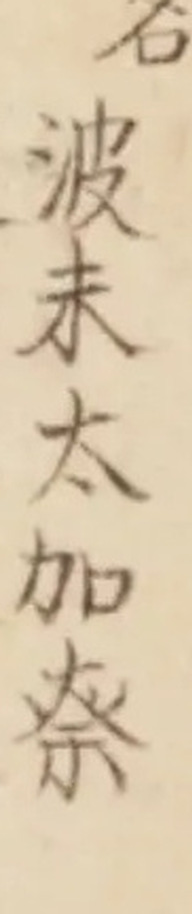波末太加𥘾
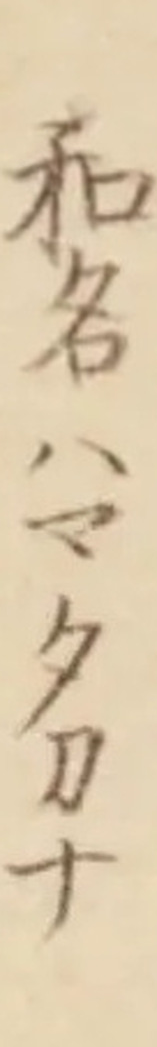和名ハマタカナ
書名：梅園草木花譜秋之部. 2
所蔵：国立国会図書館 National Diet Library, JAPAN
